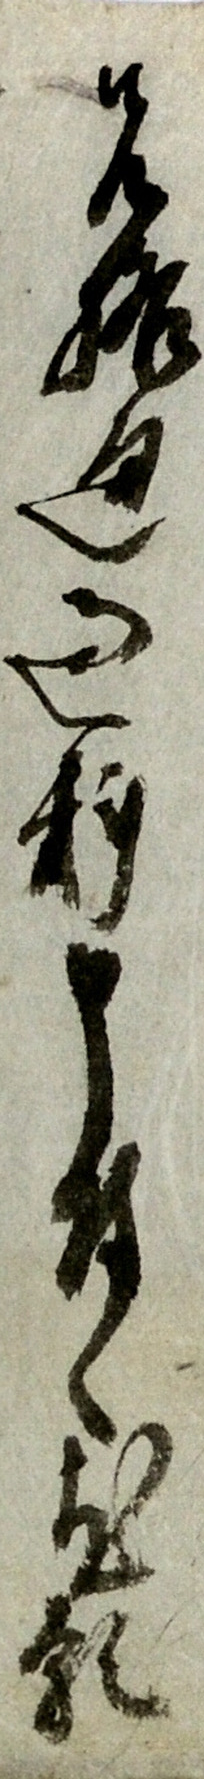先格通過料申付候尤願
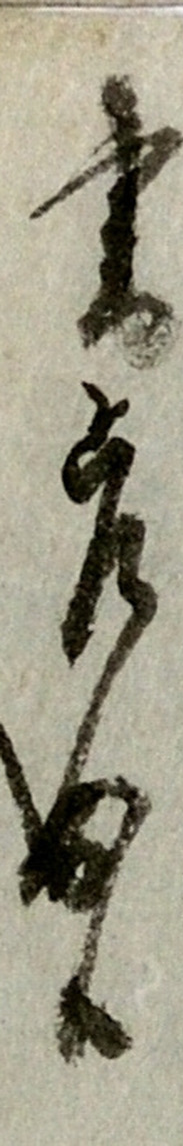書差出候

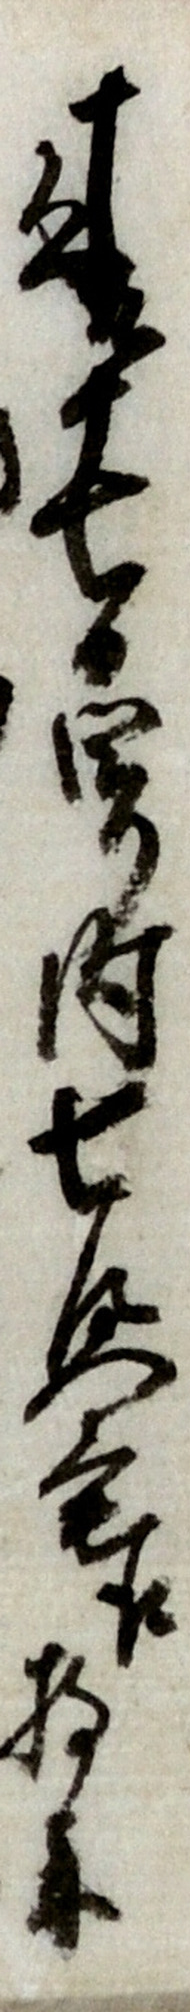来ル十七日四つ時七左衛門宅え持参
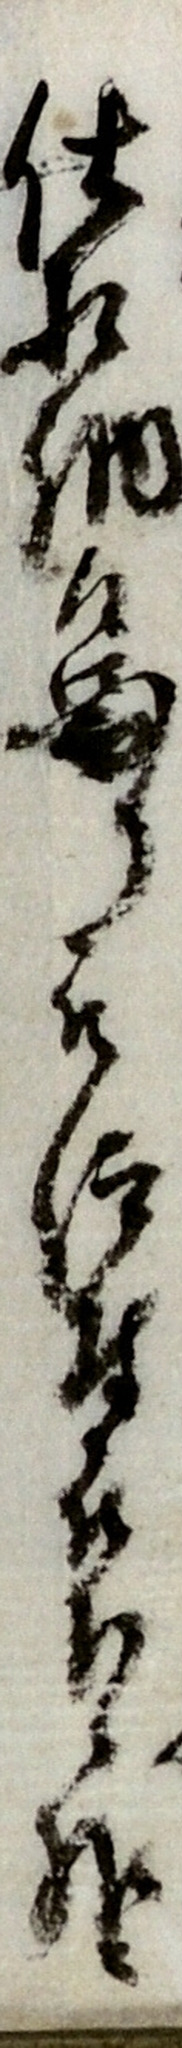仕相納候図り被仰付被下候様ニ
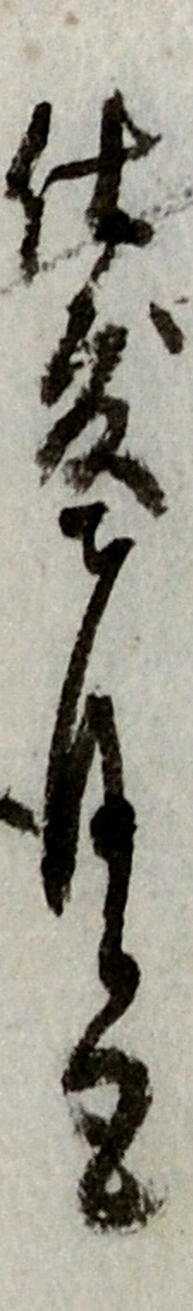仕度奉存候以上
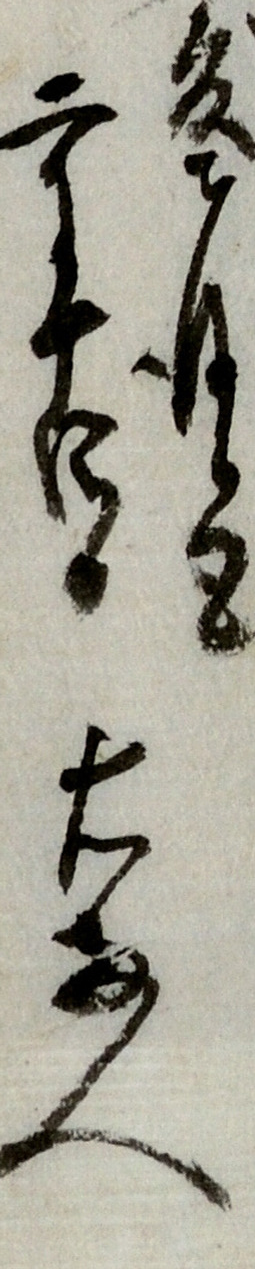二月十四日右両人
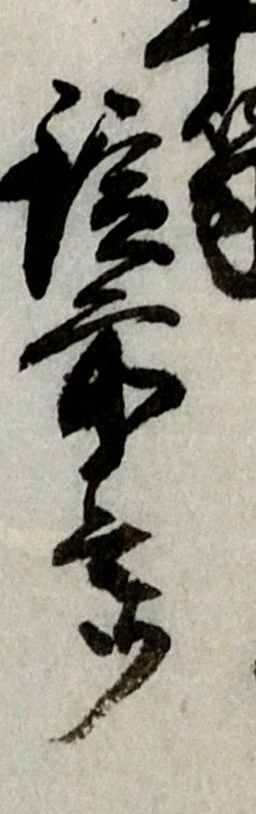錠前壱ツ
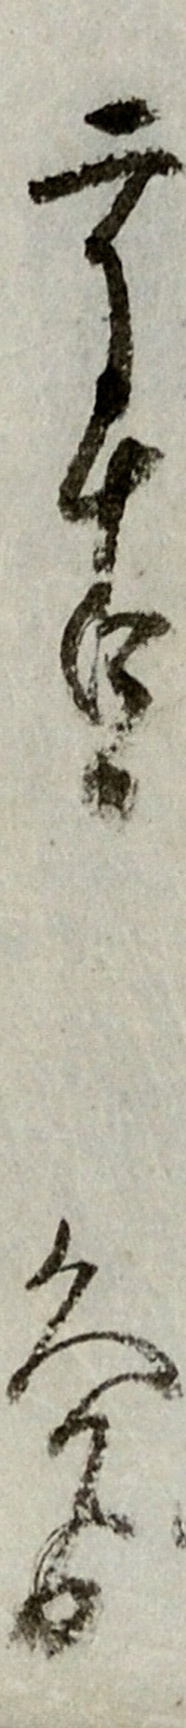二月十四日久左衛門
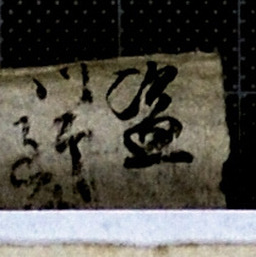十五日
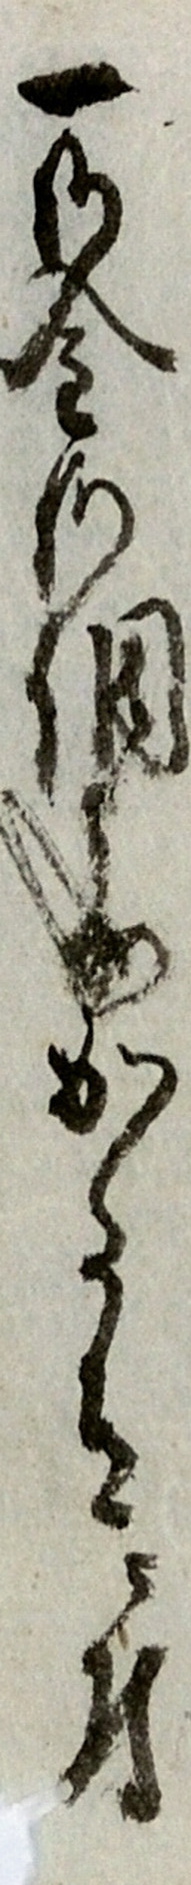一御金御調被成かたきニ付
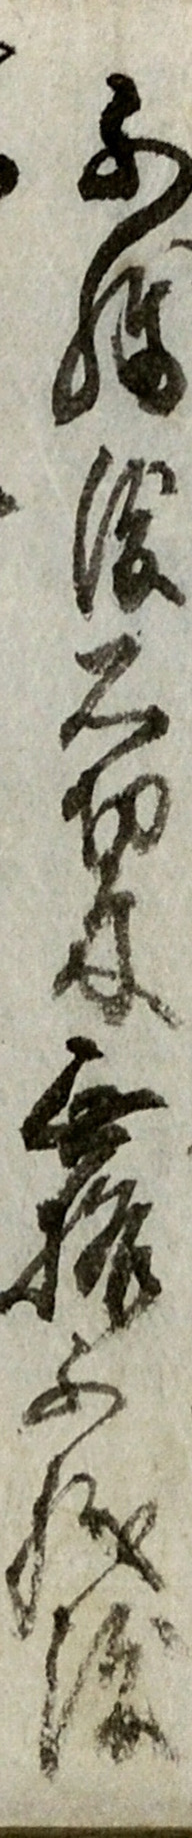不残渡石切米無格不残渡
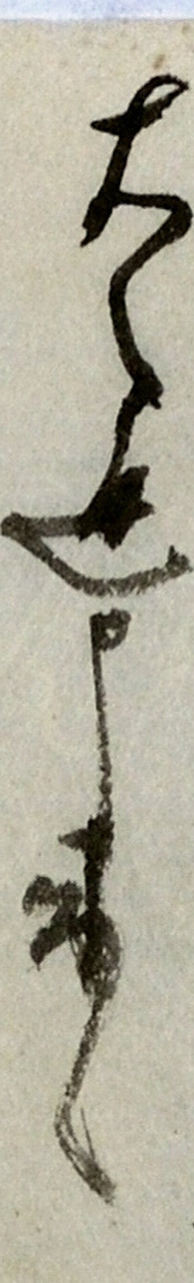右之通申来候
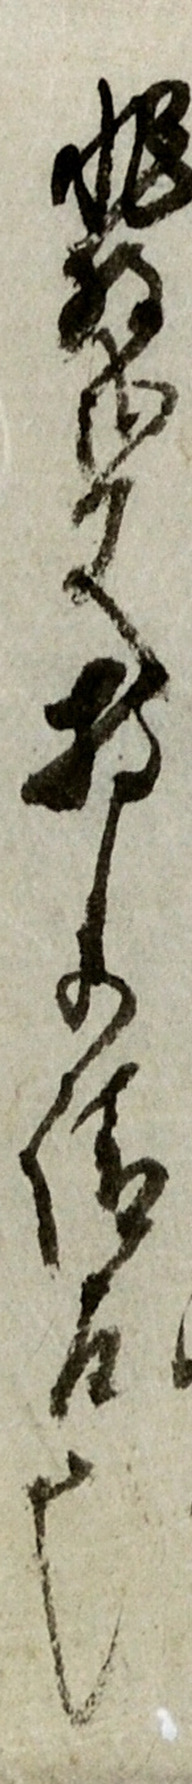非持弐文持参請取申候
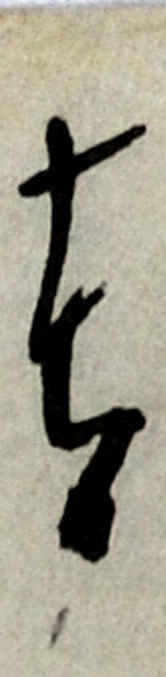十七日
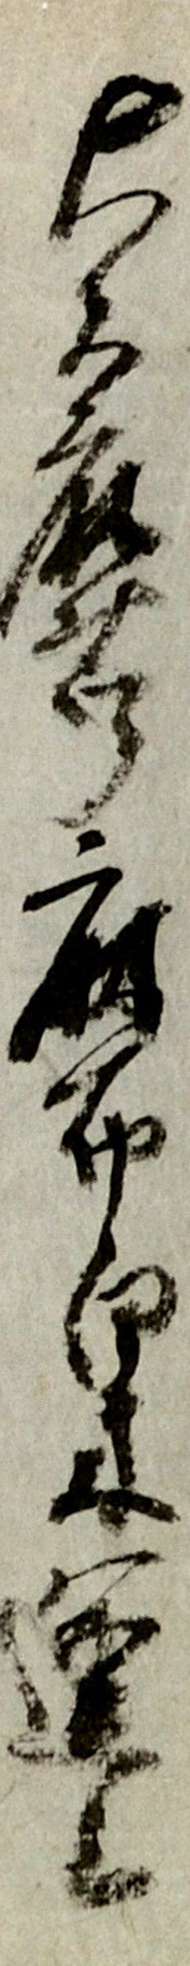右は麻苧麻布白木運上
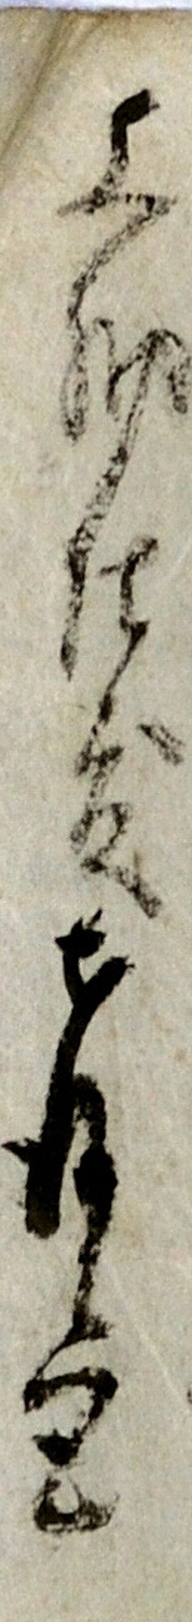上納仕度奉存候以上
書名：分一方諸事御用留帳
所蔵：伊那市立高遠町図書館・合同会社AMANE
